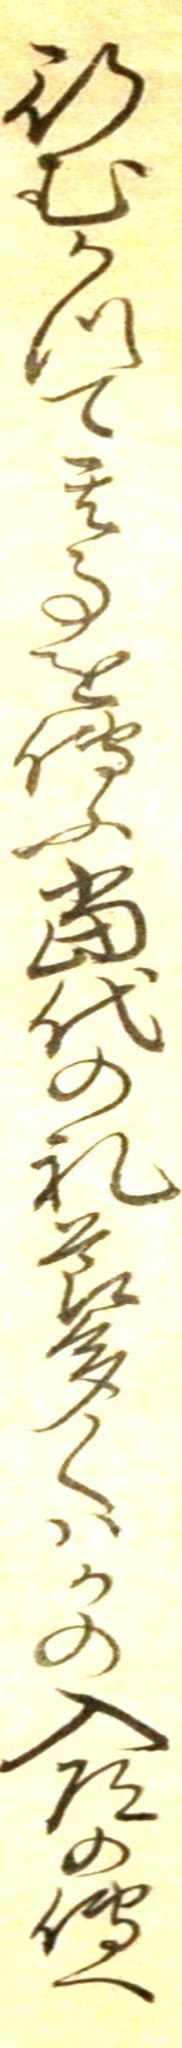行むかつて其事を伝ふ当代の礼節多くはかの入道の伝へ
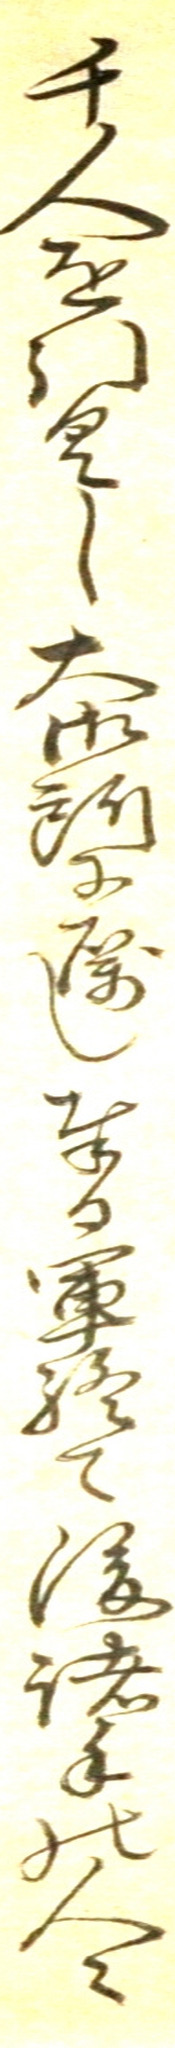千人を引具し大御所に属し奉る軍終て後諸手の人々
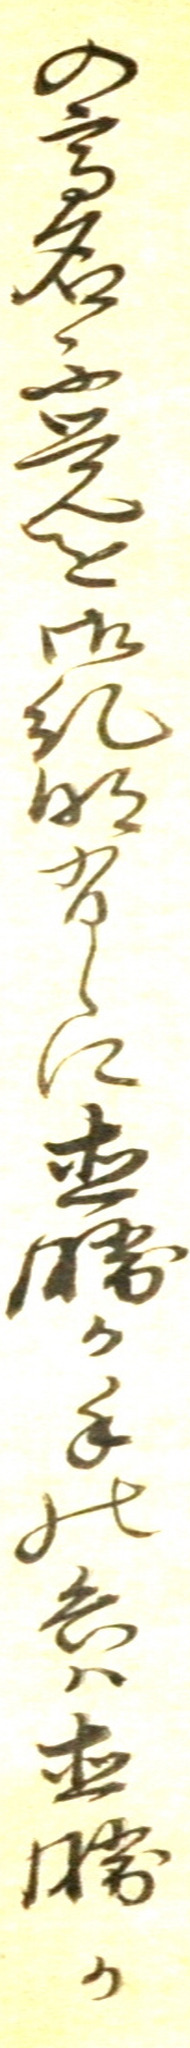の高名不覚を御糺明有しに直勝か手の兵は直勝か
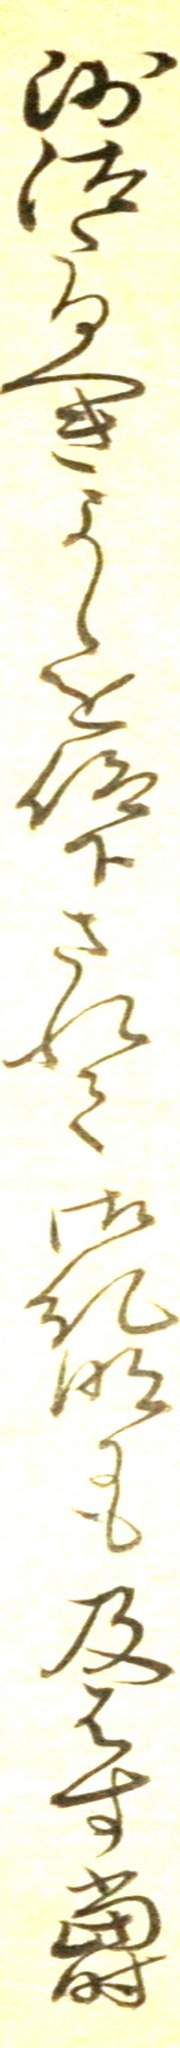沙汰たるへきよしを仰下されて御糺明にも及はす当時
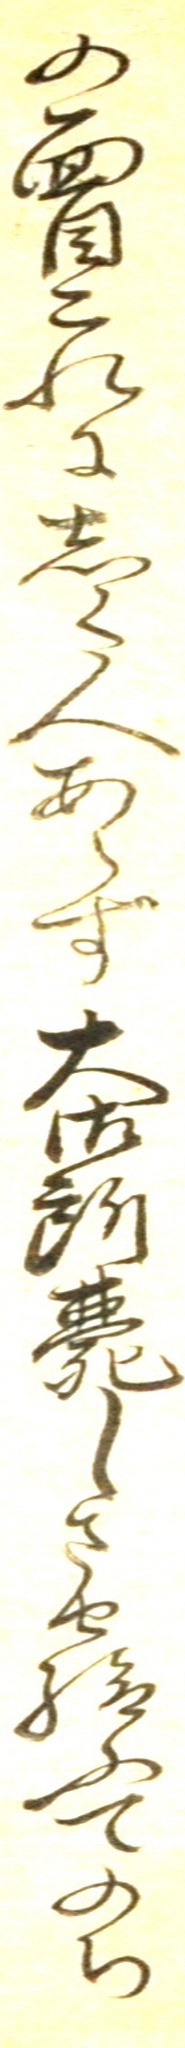の面目これにしく人あらず大御所薨しさせ給ふてのち
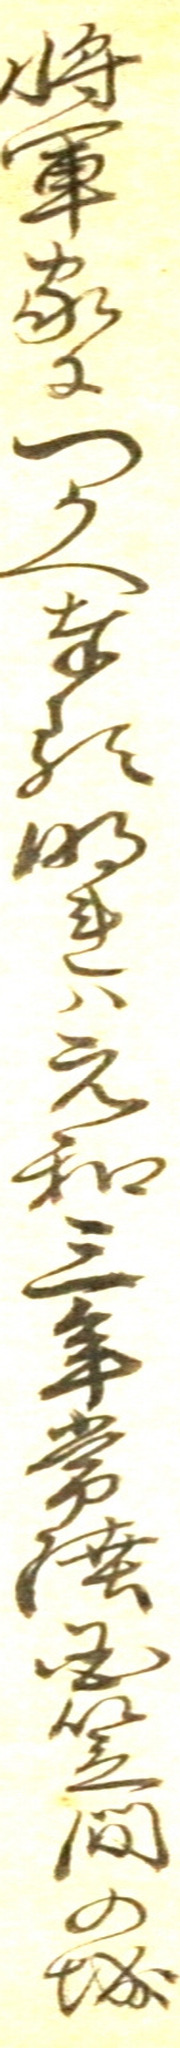将軍家につかへ奉る明れは元和三年常陸国笠間の城

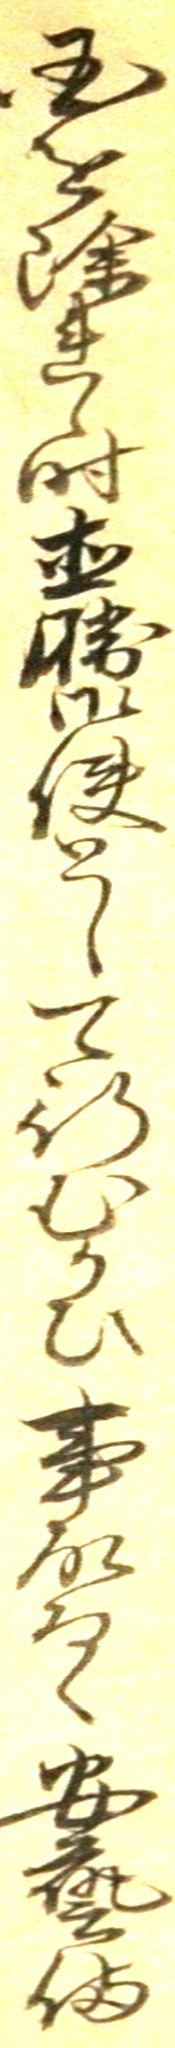国を除れし時直勝御使として行むかひ事故なく安芸備
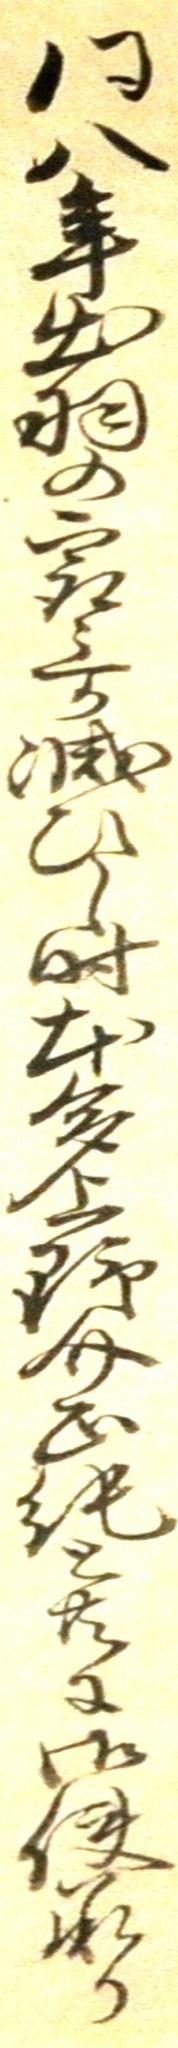同八年出羽の最上か滅ひし時本多上野介正純と共に御使承り
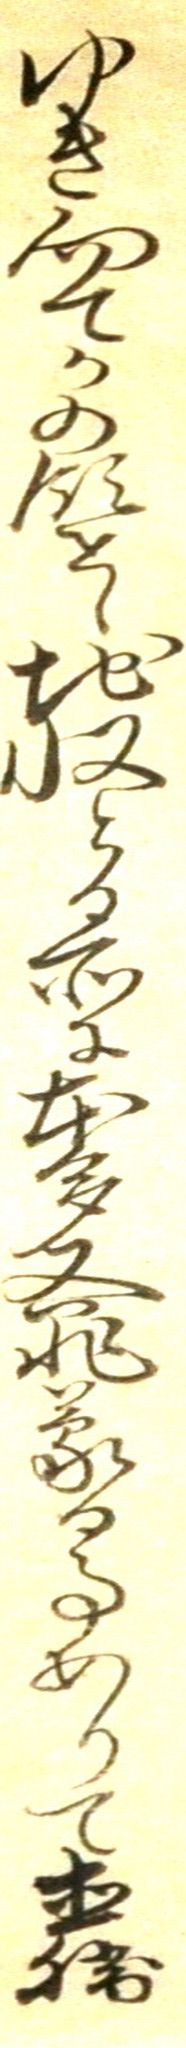ゆき向てかの領せし地收とる所に本多又罪蒙る事ありて直勝
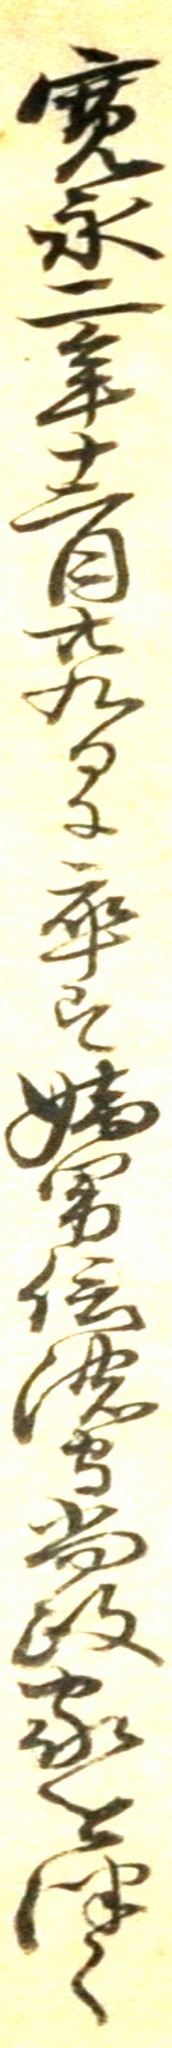寛永二年十二月廿九日に卒す嫡男信濃守尚政家をつく
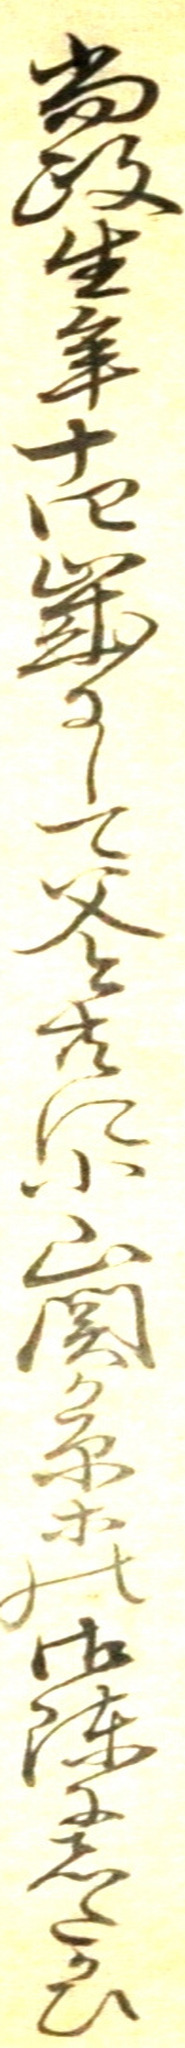尚政生年十四歳にして父と共に小山関か原等の御陣にしたかひ
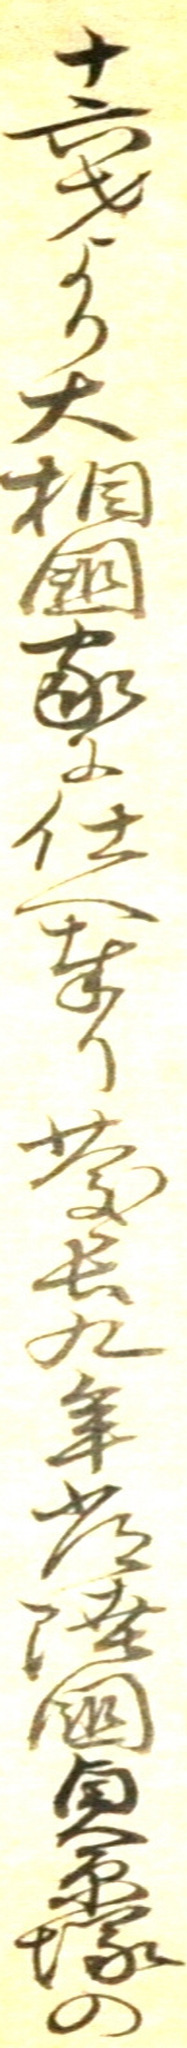十六才より大相国家に仕へ奉り慶長九年常陸国貞原塚の
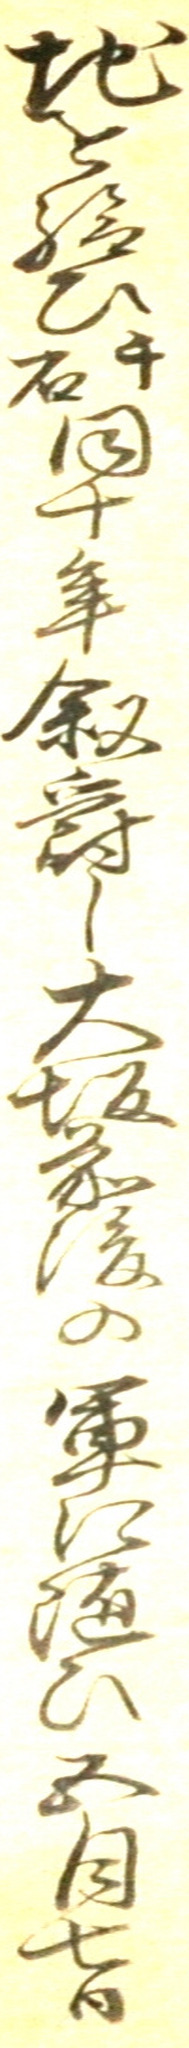地を給ひ千石同十年叙爵し大坂前後の軍に随ひ五月七日
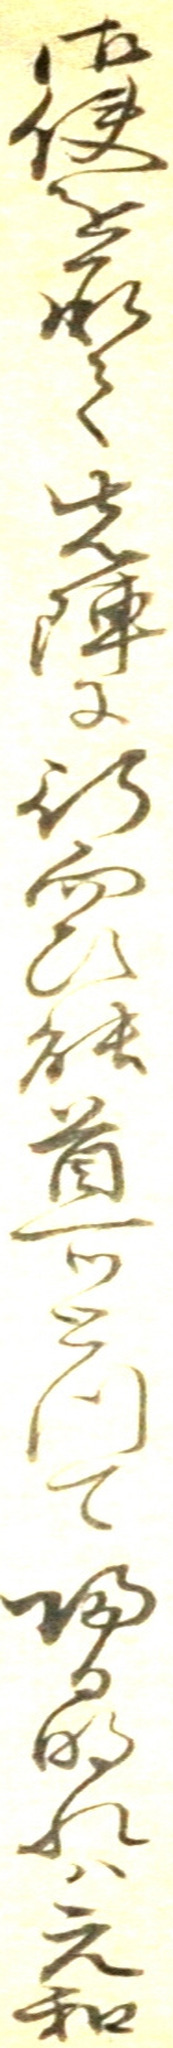御使を承て先陣に行向ひ能首一ッとつて帰る明れは元和
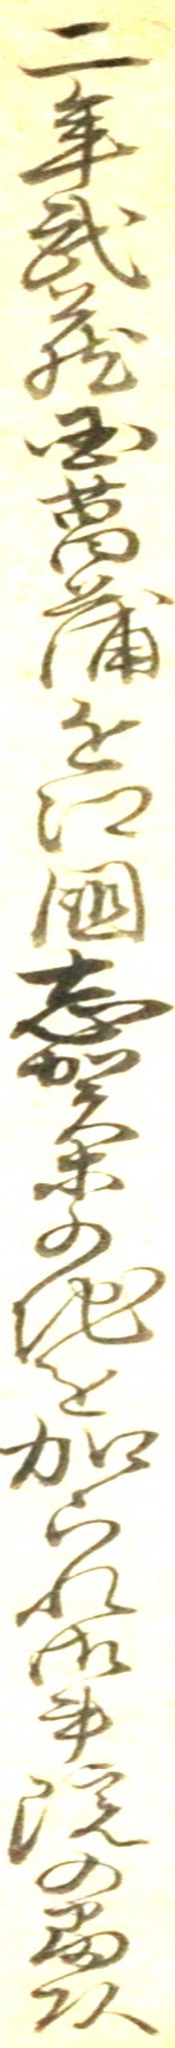二年武蔵国菖蒲近江国志賀等の地を加られ御書院の番頭
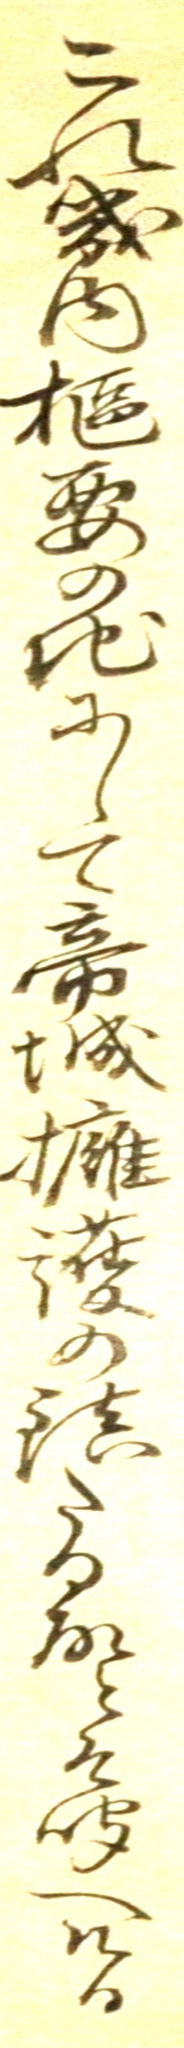これ畿内枢要の地にして帝城擁護の鎮たる故とそ聞へける
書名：藩翰譜（五）
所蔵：伊那市立高遠町図書館・合同会社AMANE
